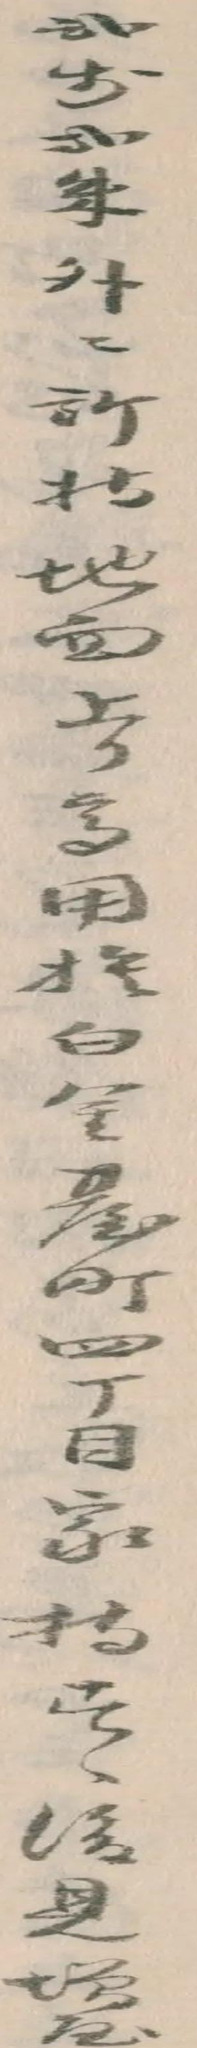弐歩弐朱外所持地面上りて用捨白金台町四丁目家持すゝ後見増屋
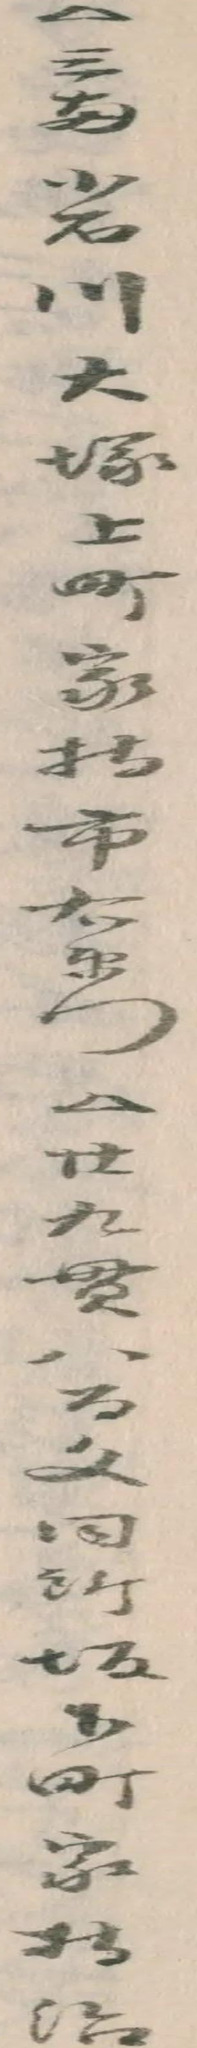△三両小石川大塚上町家持市右衛門△廿九貫八百文同所坂下町家持治
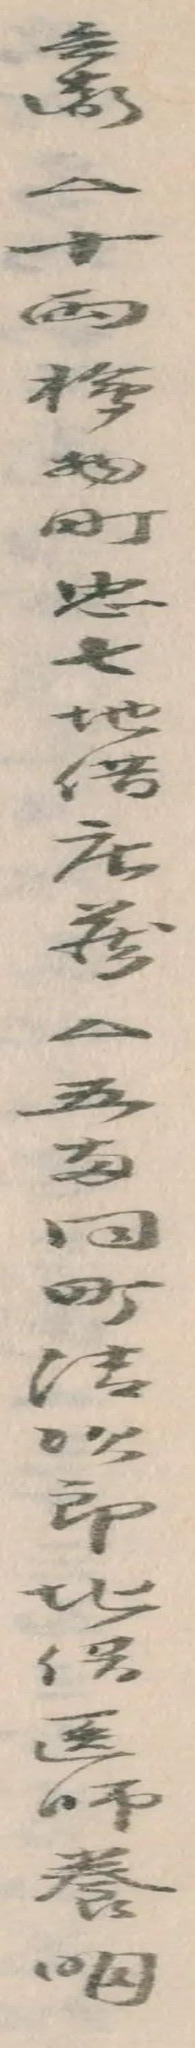兵衛△十両檜物町忠七地借庄蔵△五両同町清次郎地借医師養明
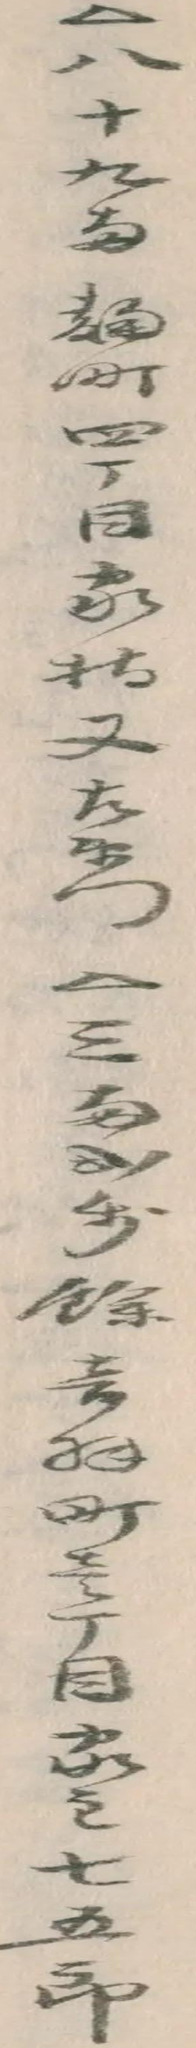△八十九両麹町四丁目家持又左衛門△三両二歩余音羽町壹丁目家主七五郎
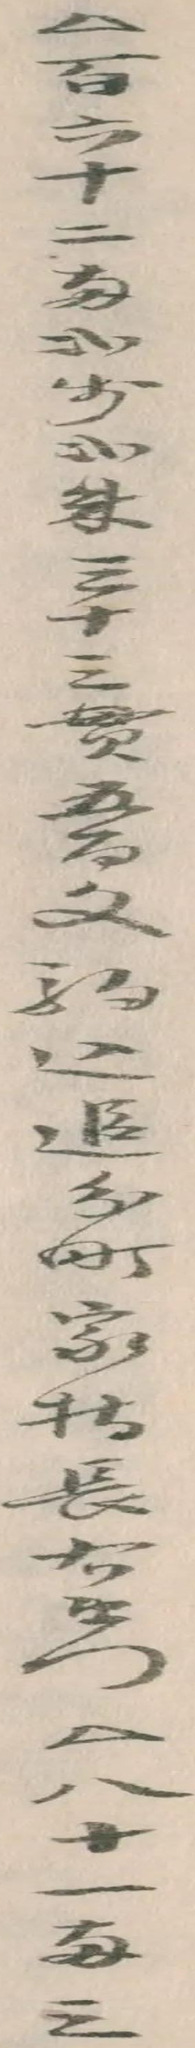△百六十二両弐歩弐朱三十三貫五百文駒込追分町家持長右衛門△八十一両三
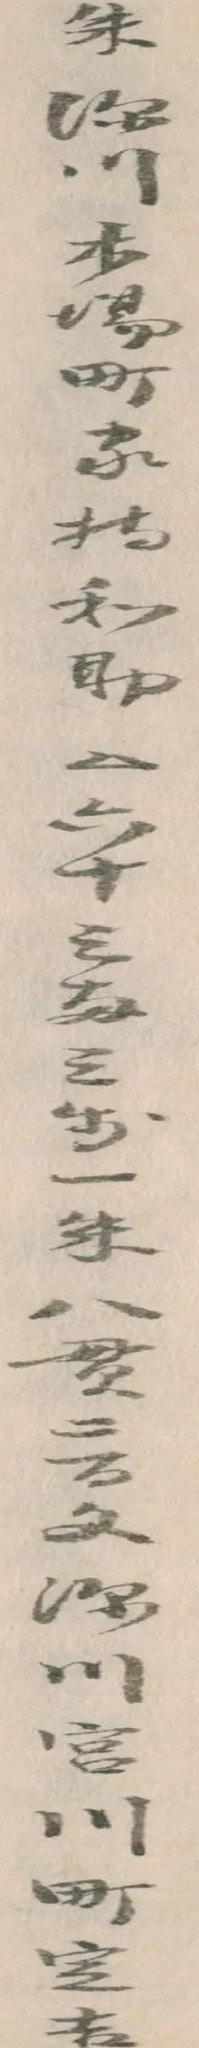朱深川木場町家持和助△六十三両三歩一朱八貫二百文深川宮川町定吉
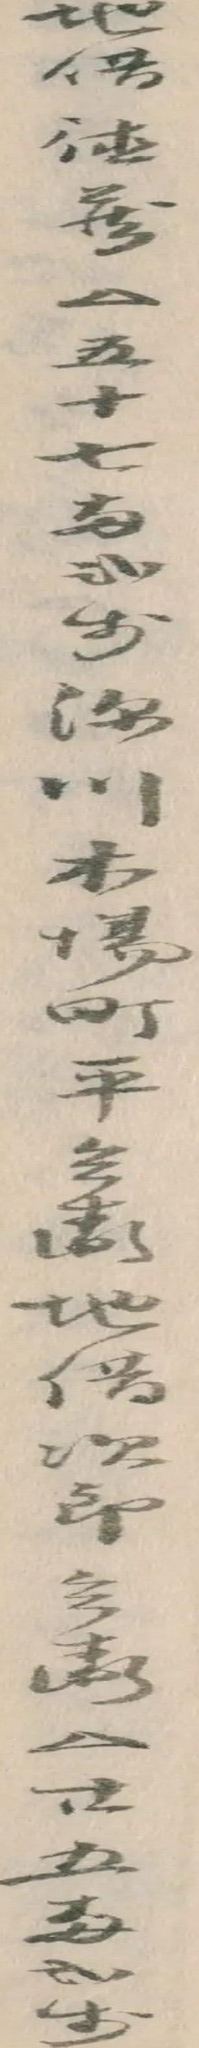地借徳蔵△五十七両弐歩深川木場町平兵衛地借次郎兵衛△廿五両弐歩

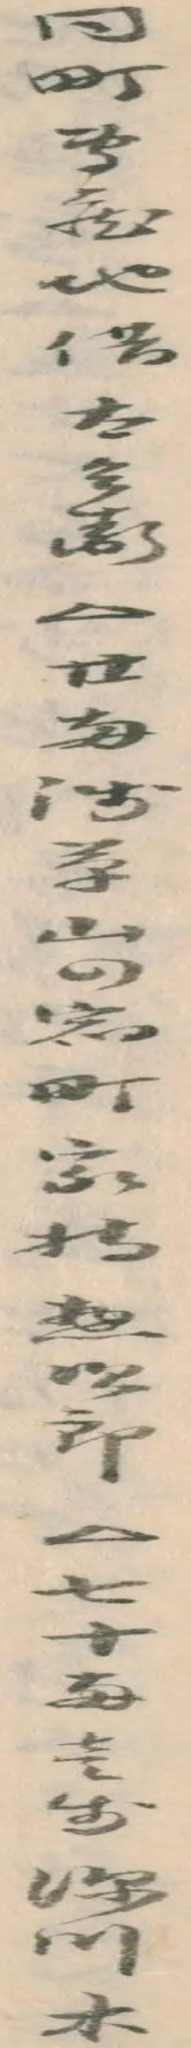同町専蔵地借太兵衛△廿両浅草山の宿町家持惣次郎△七十両壹歩深川木
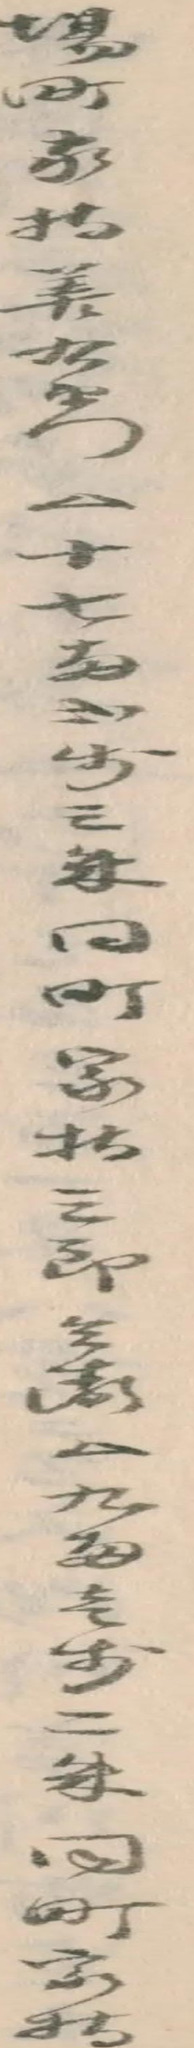場町家持善右衛門△十七両弐歩三朱同町家持三郎兵衛△九両壱歩二朱同町家持
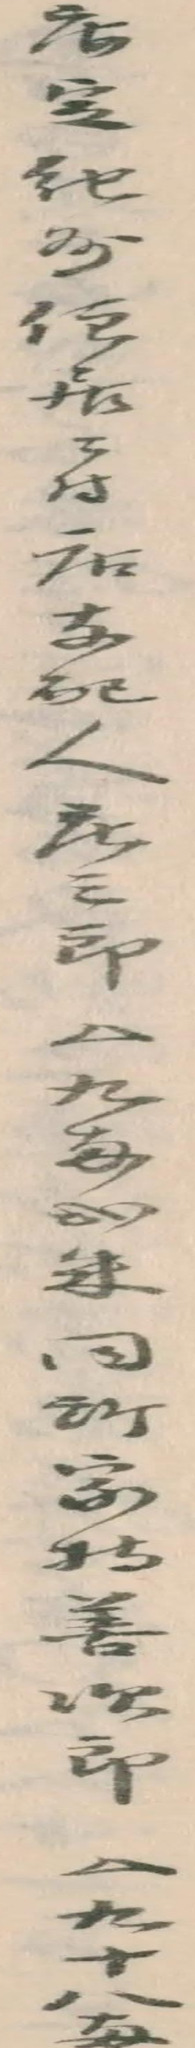庄定紀州住居付店支配人庄三郎△九両弐朱同所家持善次郎△九十八両
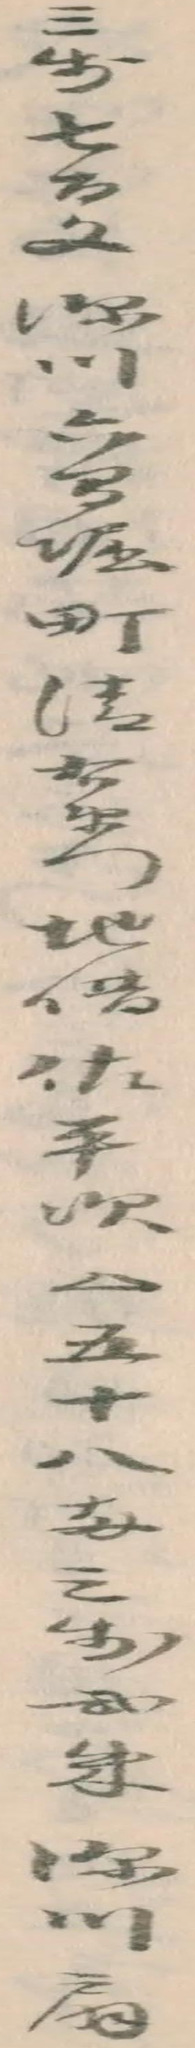三歩七百文深川六間堀町清右衛門地借佐平次△五十八両三歩弐朱深川扇
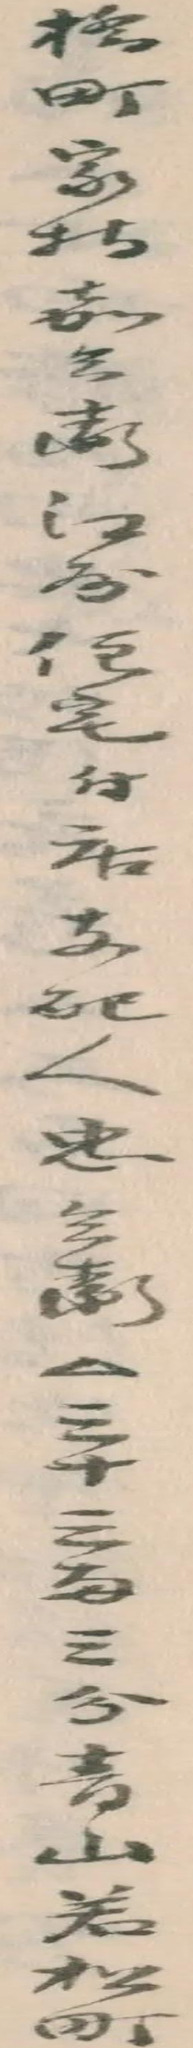橋町家持嘉兵衛江州住宅付店支配人忠兵衛△三十三両三分青山若松町
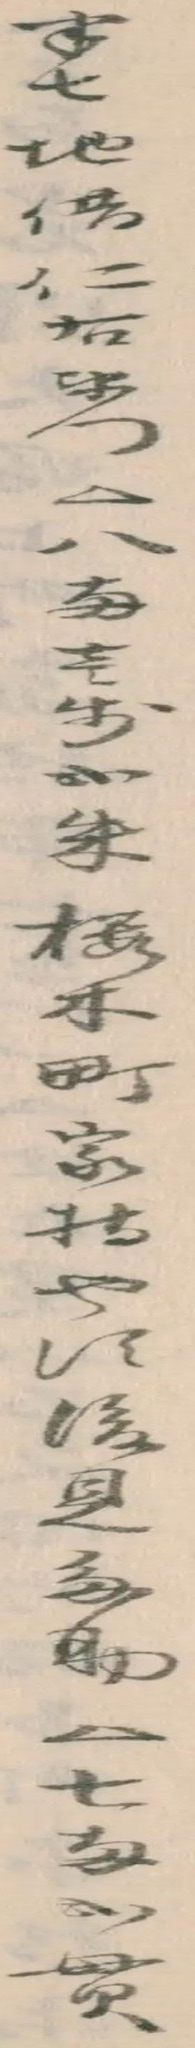半七地借仁右衛門△八両壱歩弐朱桜木町家持やす後見多助△七両弐貫
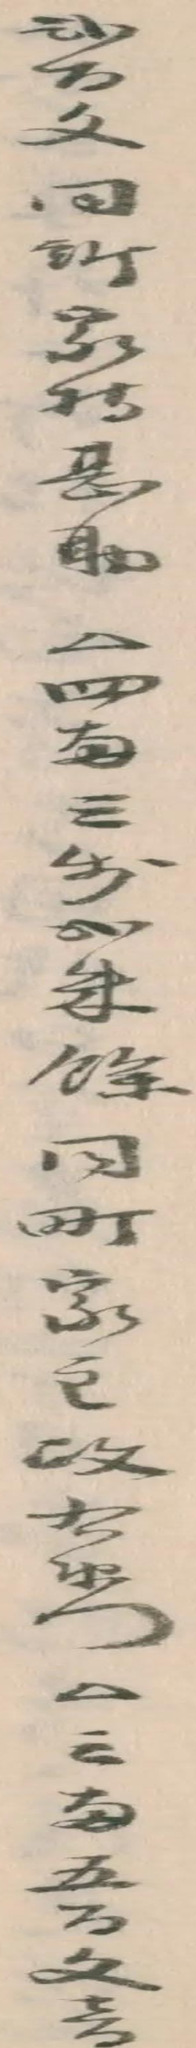弐百文同所家持甚助△四両三歩弐朱余同町家主政右衛門△三両五百文音
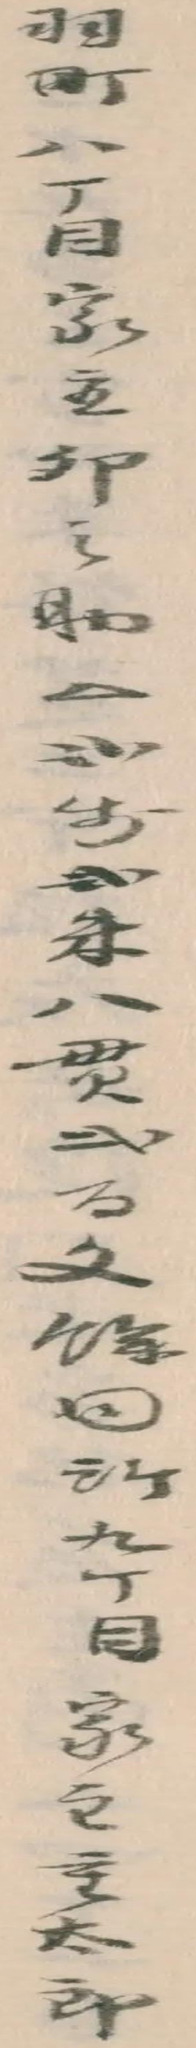羽町八丁目家主卯之助△弐歩弐朱八貫弐百文余同所九丁目家主重太郎
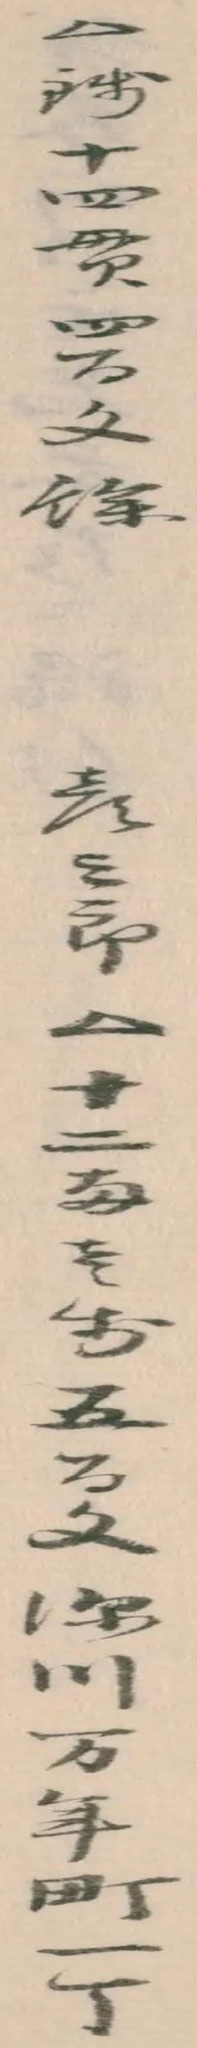△銭十四貫四百文余彦三郎△十二両壱歩五百文深川万年町一丁
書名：地災撮要. 巻10(地震之部) 上,下
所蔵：国立国会図書館 National Diet Library, JAPAN
